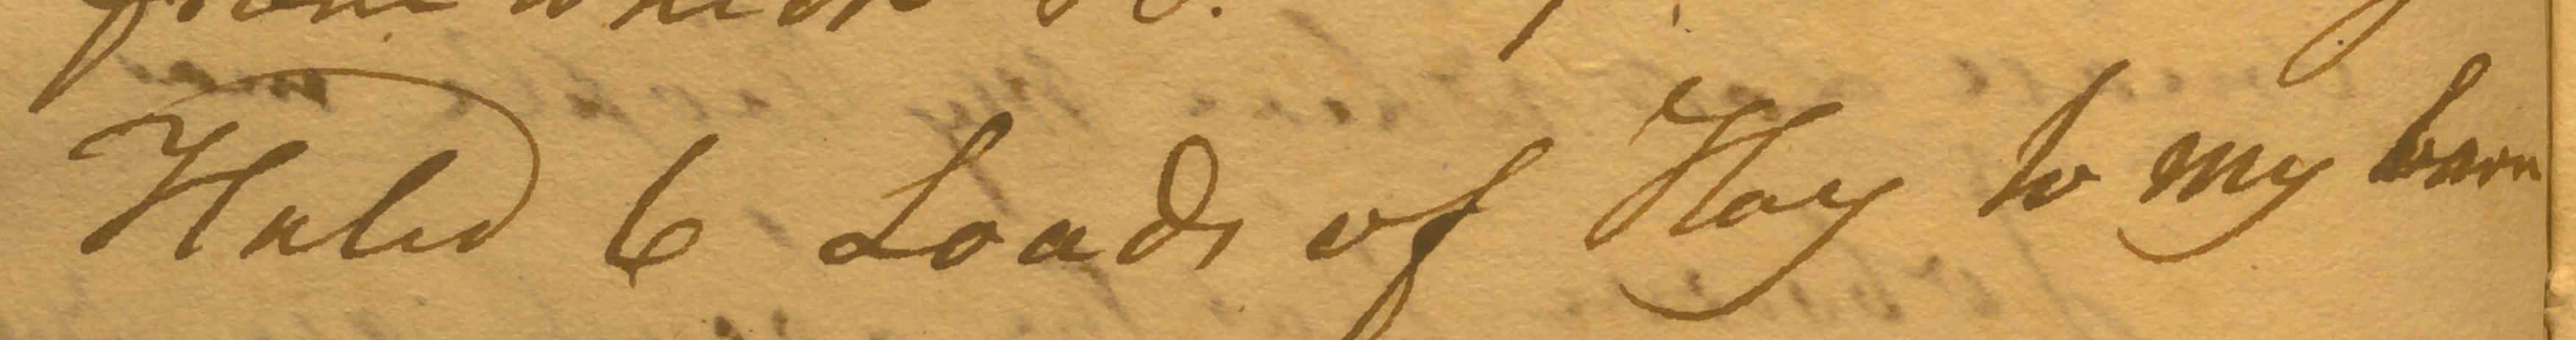Haled 6 Loads of Hay to my barn
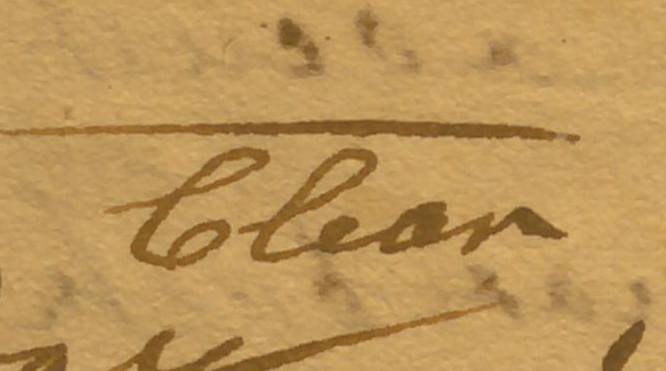Clear
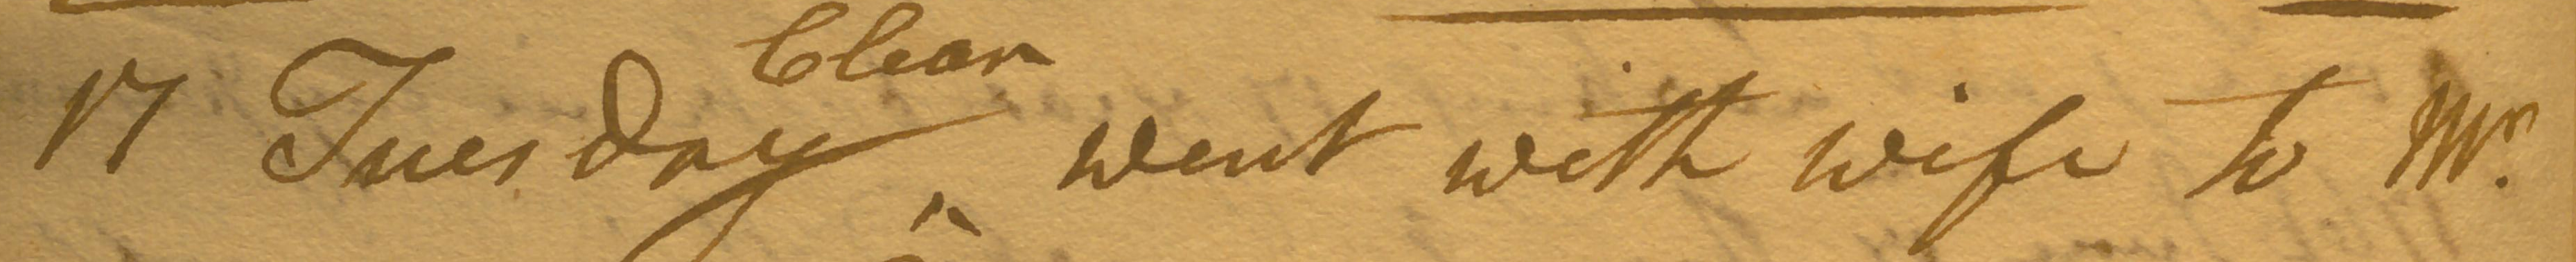17 Tuesday ^ went with wife to M^r.
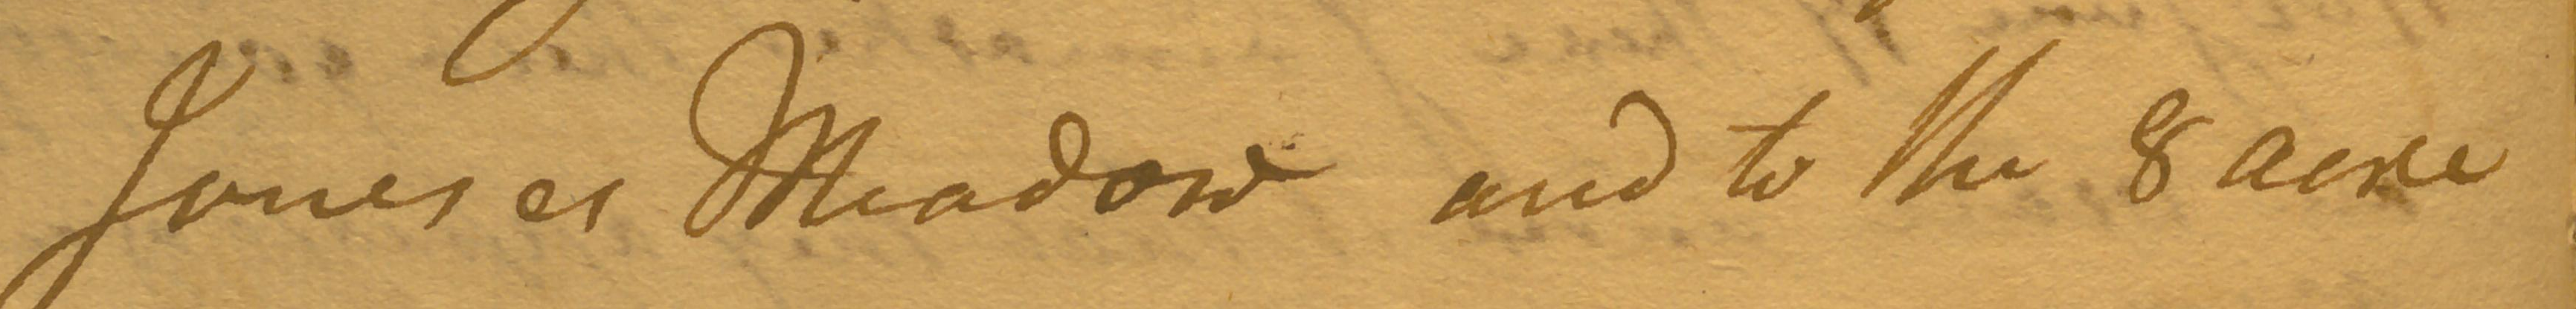Joneses Meadow and to the 8 acre
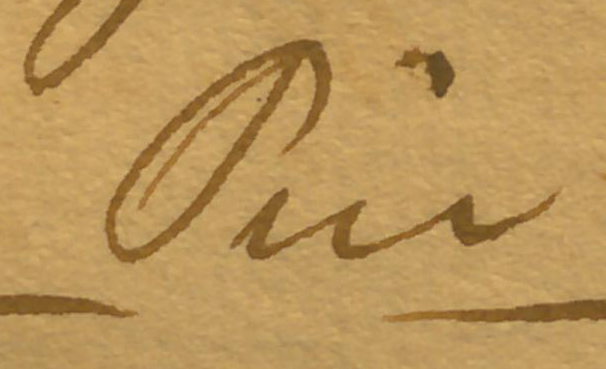Pice
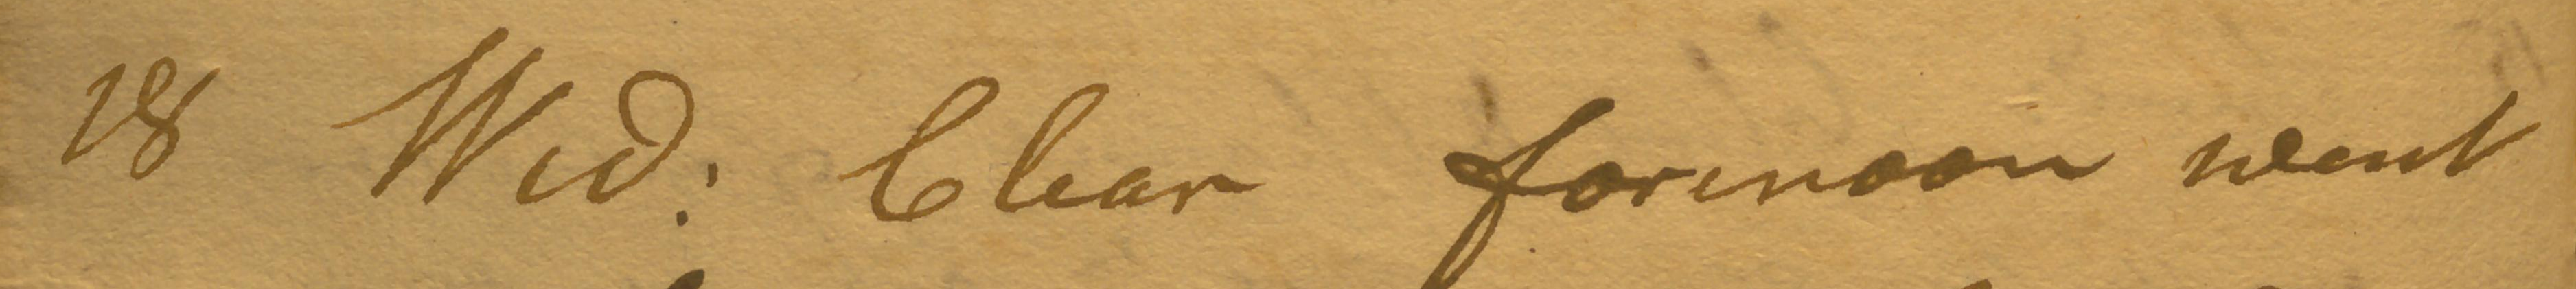18 Wed. Clear forenoon went
